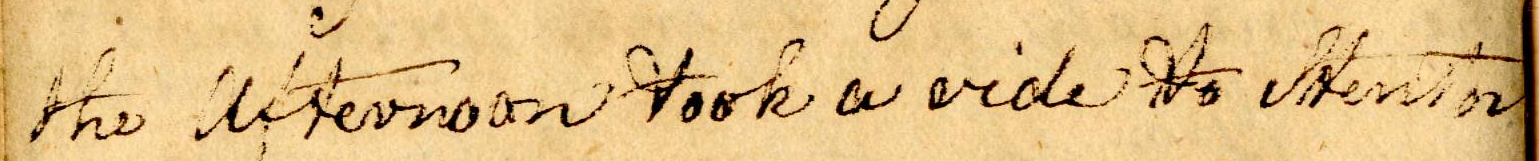the Afternoon took a ride to Stenton
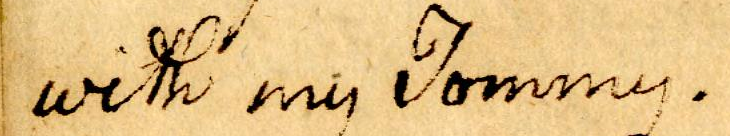with my Tommy.
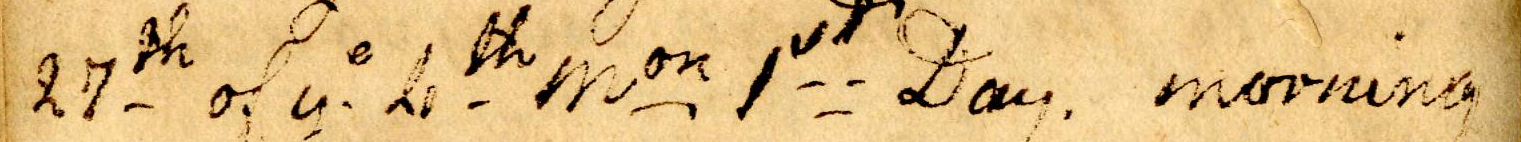27^th of y^e 4^th M^on 1^st Day. morning
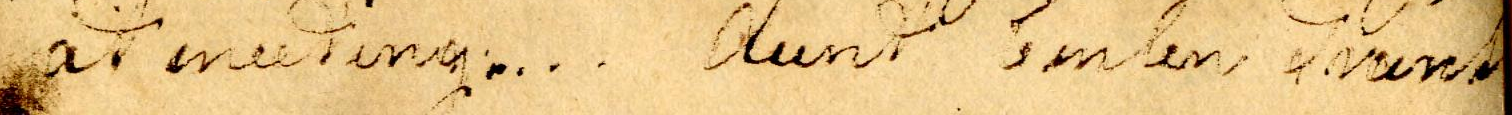at meeting .... Aunt Emlen drank
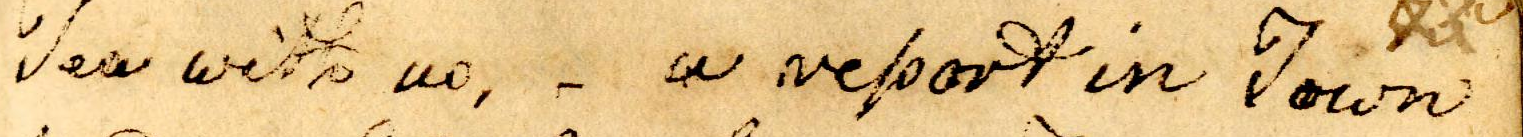Tea with us, - a report in Town
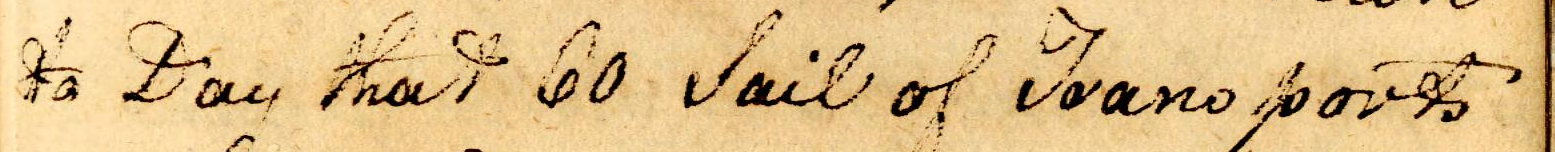to Day that 60 Sail of Transports
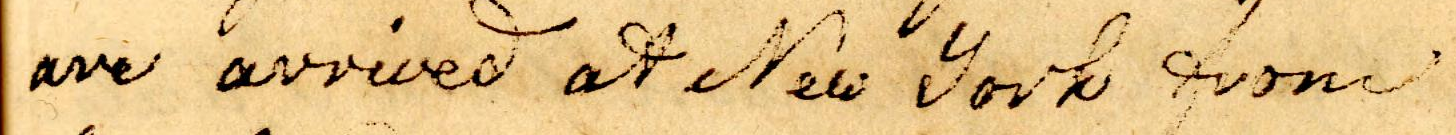are arrived at New York from
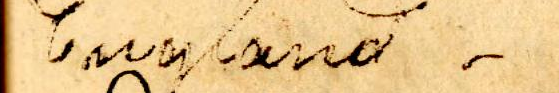England -
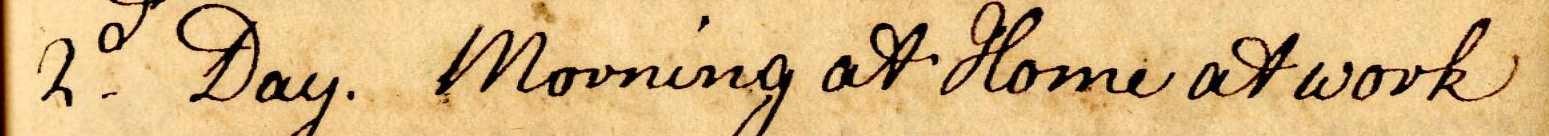2^d Day. Morning at Home at work
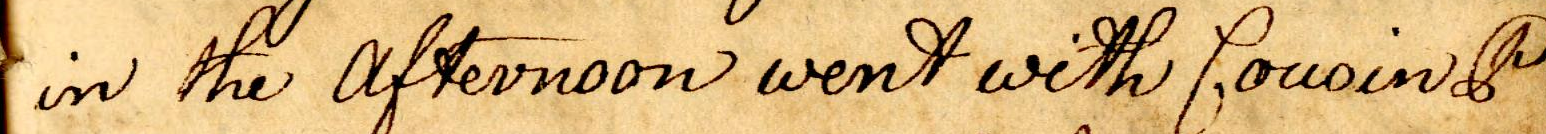in the Afternoon went with Cousin P
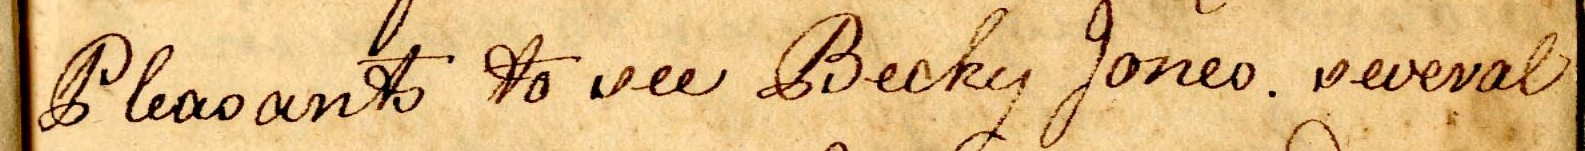Pleasant to see Becky Jones. several
